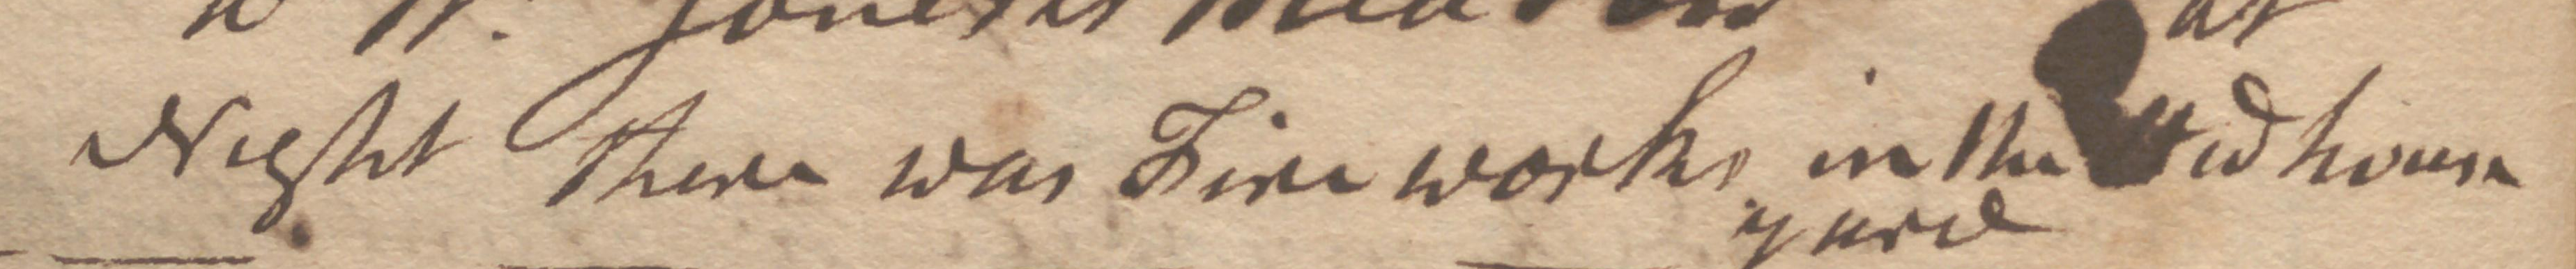Night there was Fire works, in the sted house
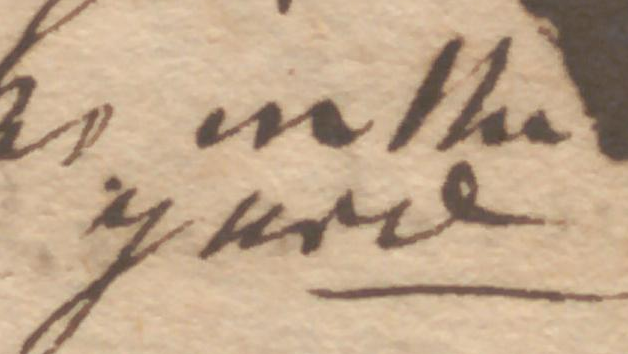yard
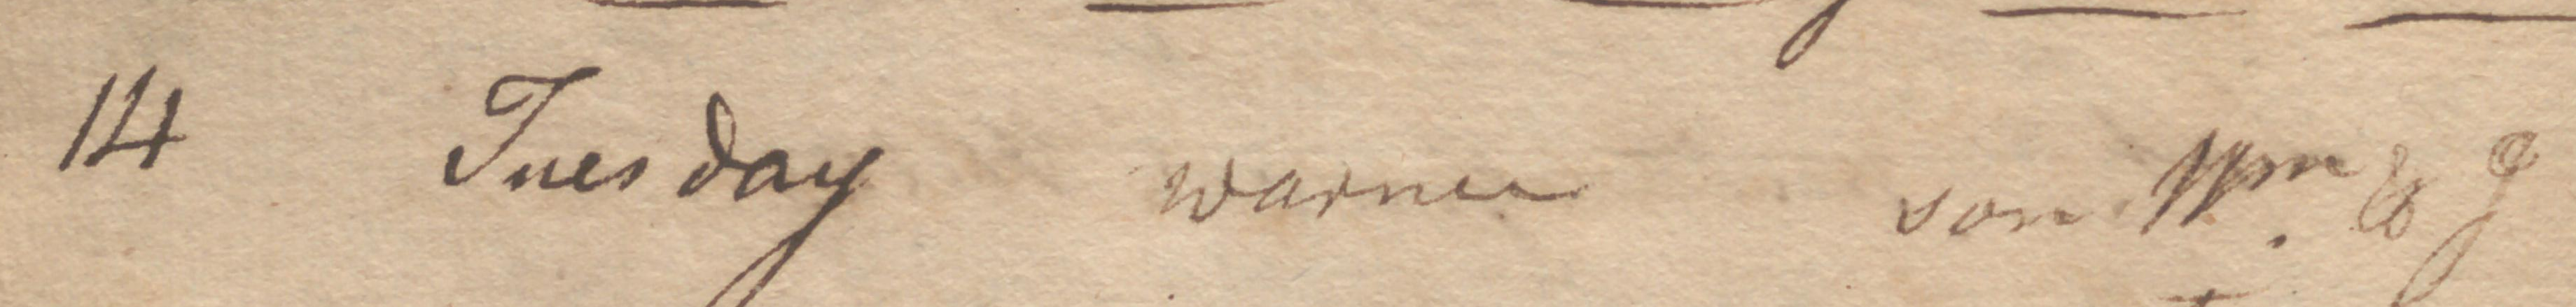14 Tuesday warme son W^m. & I
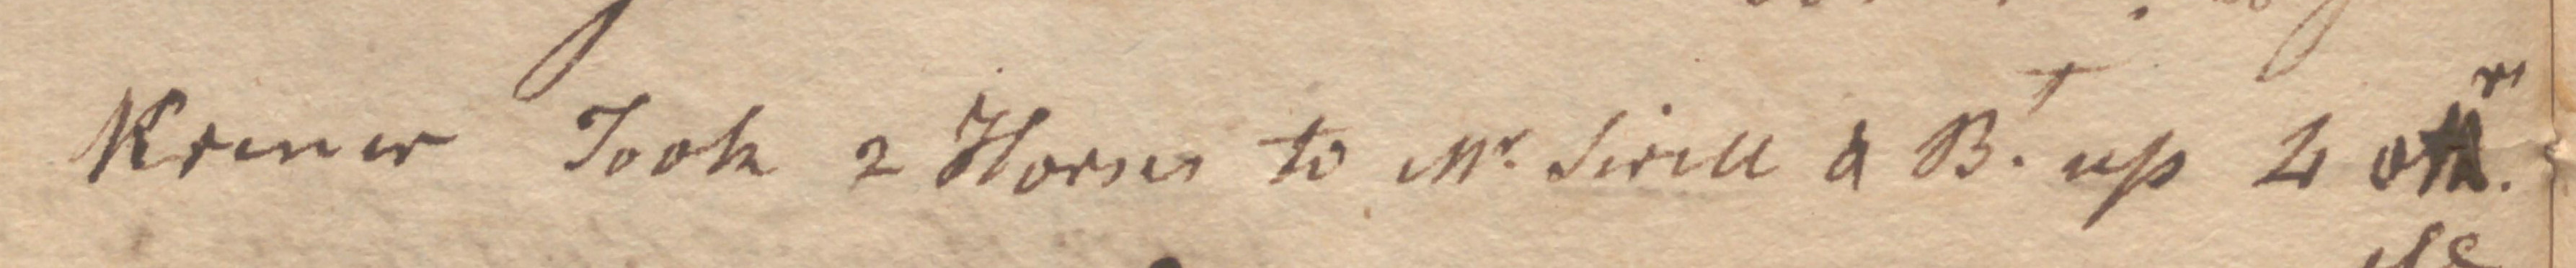Krener Took 2 Horses to M^r. Sirell & B^t. up 4 oth^rs.
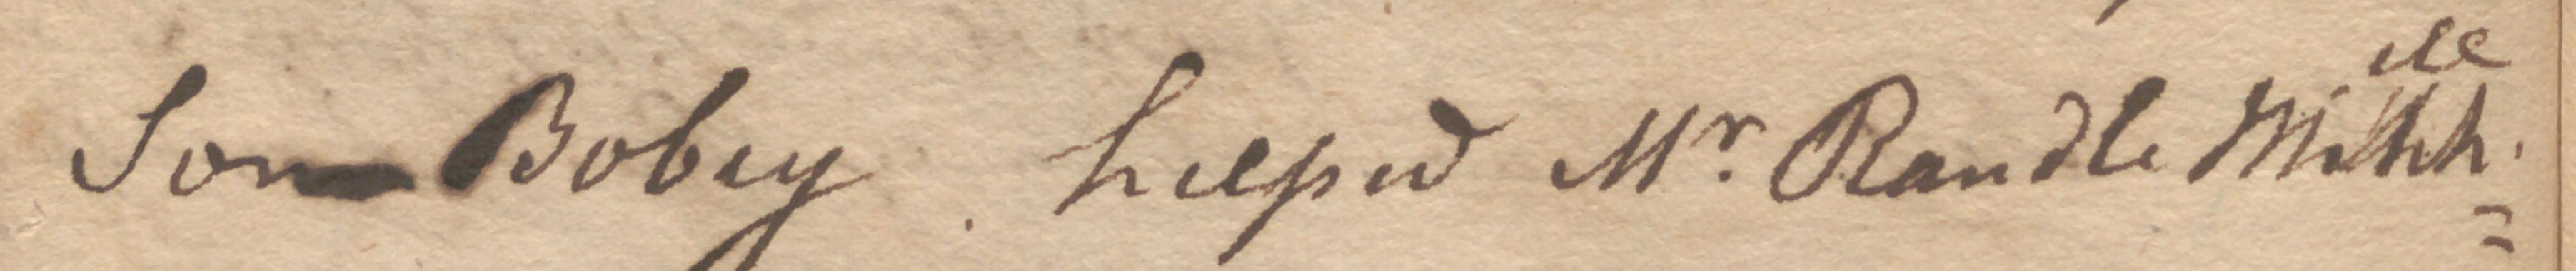Son Bobey helped M^r. Randle Mitch^ell
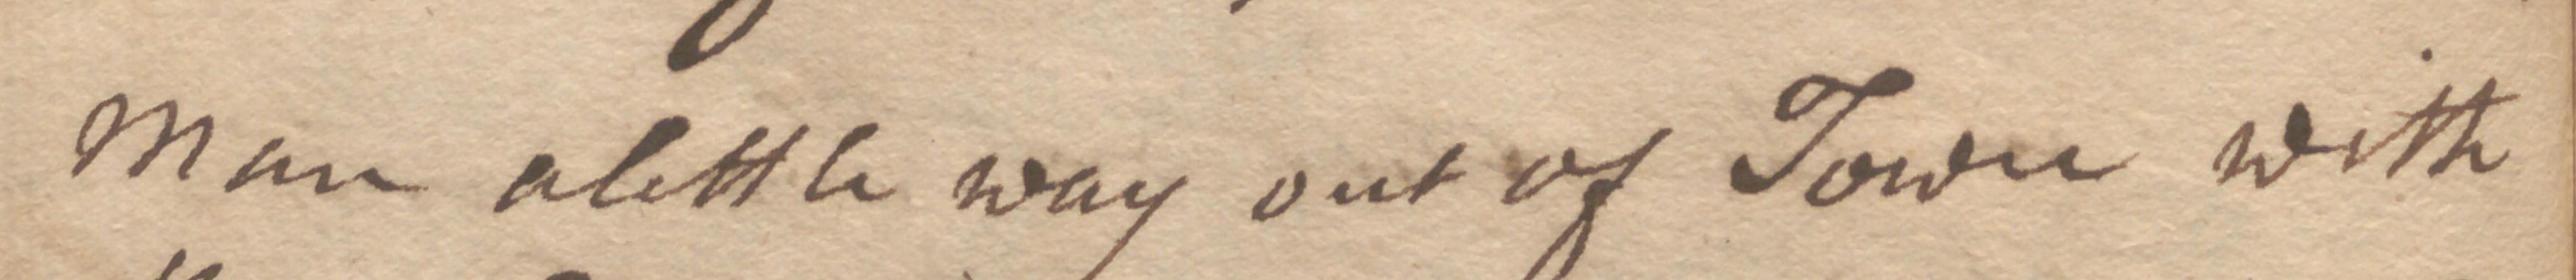Man a little way out of Towne with
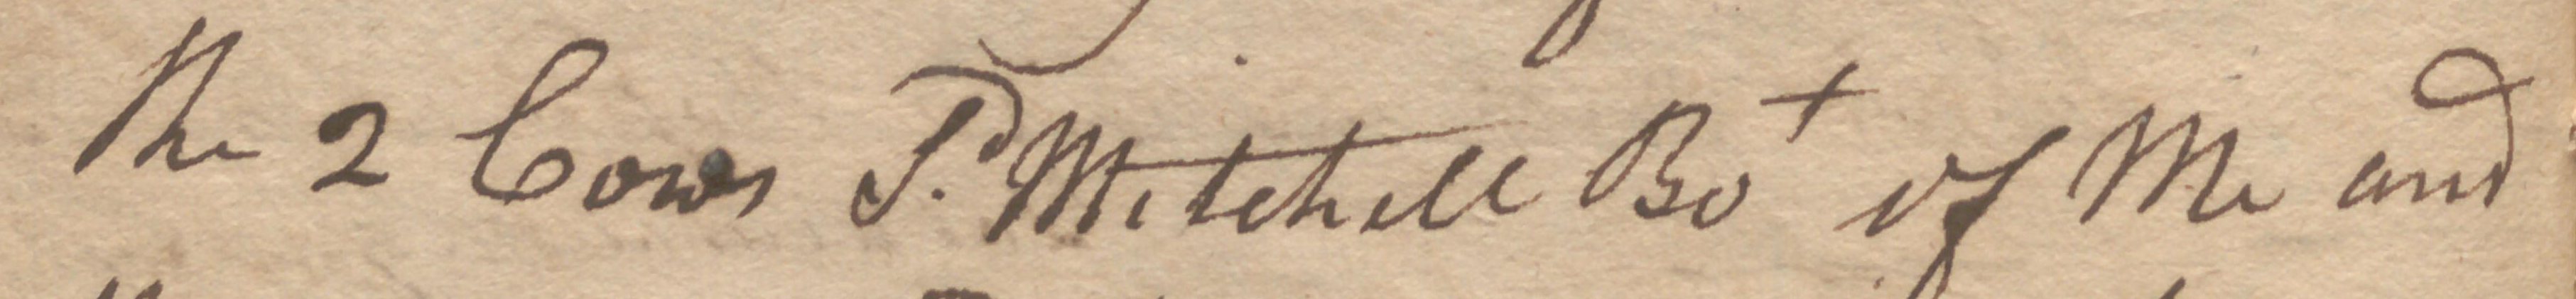the 2 Cows S^d. Mitchell Bo^t of Me and
